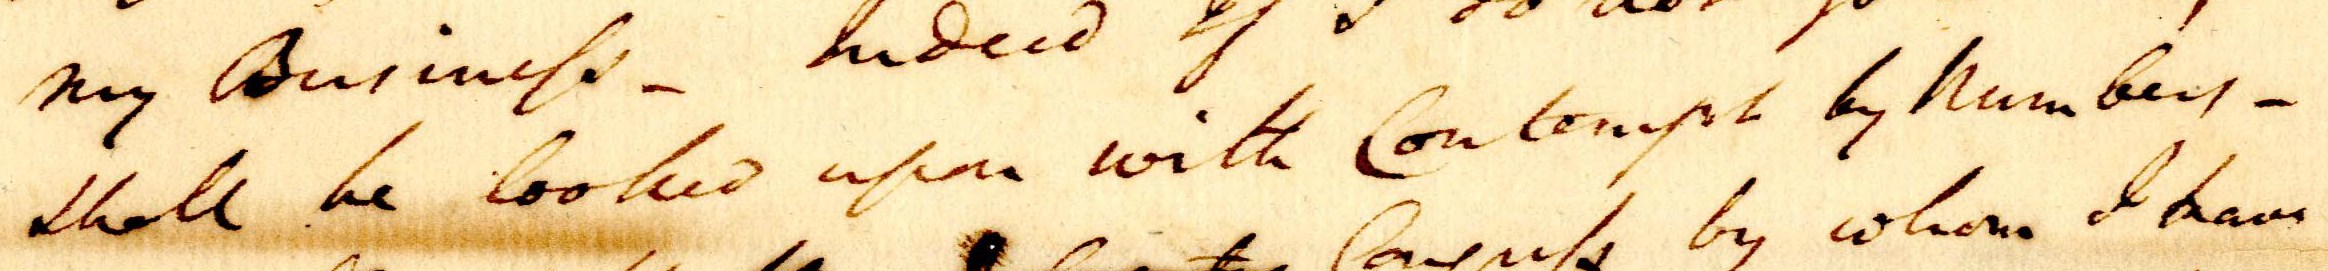shall be looked upon with Contempt by Numbers
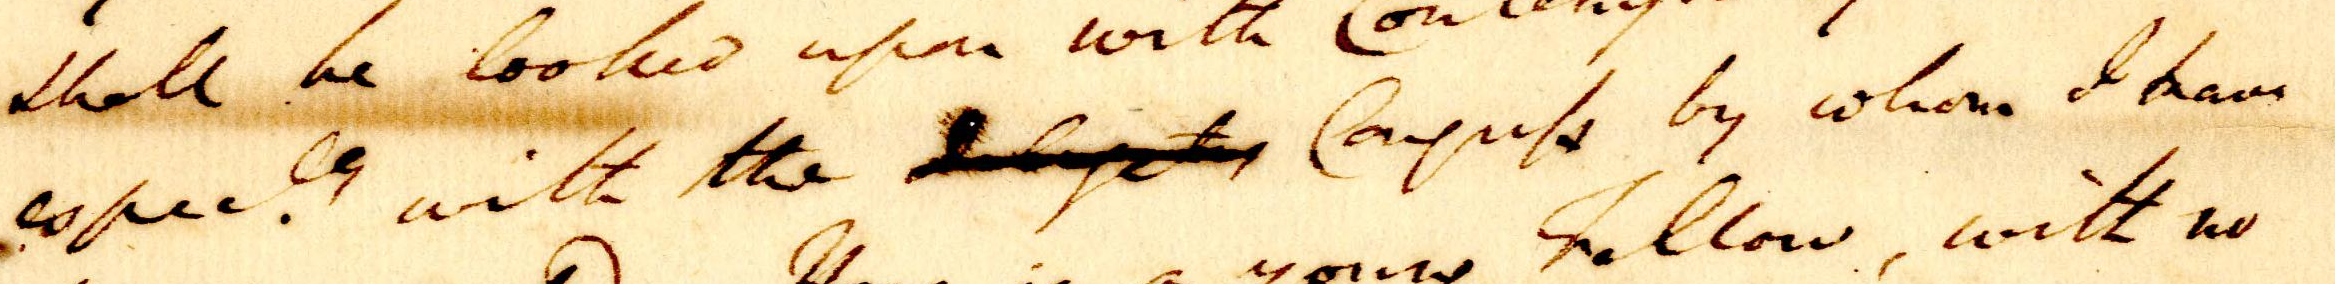espec^ly with the [_____] Congress by whom I have
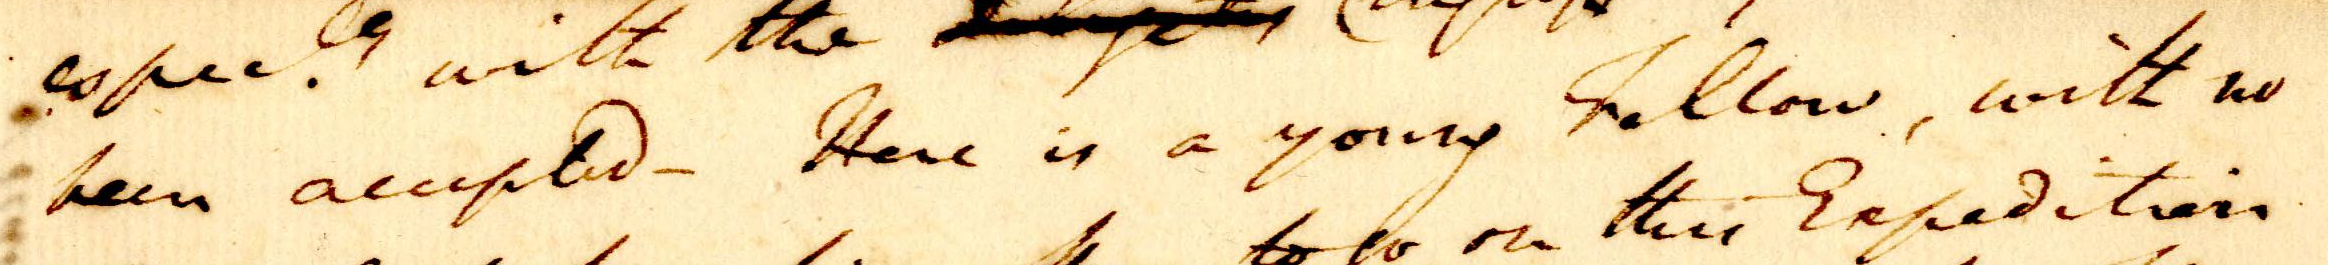been accepted. Here is a young Fellow, with no
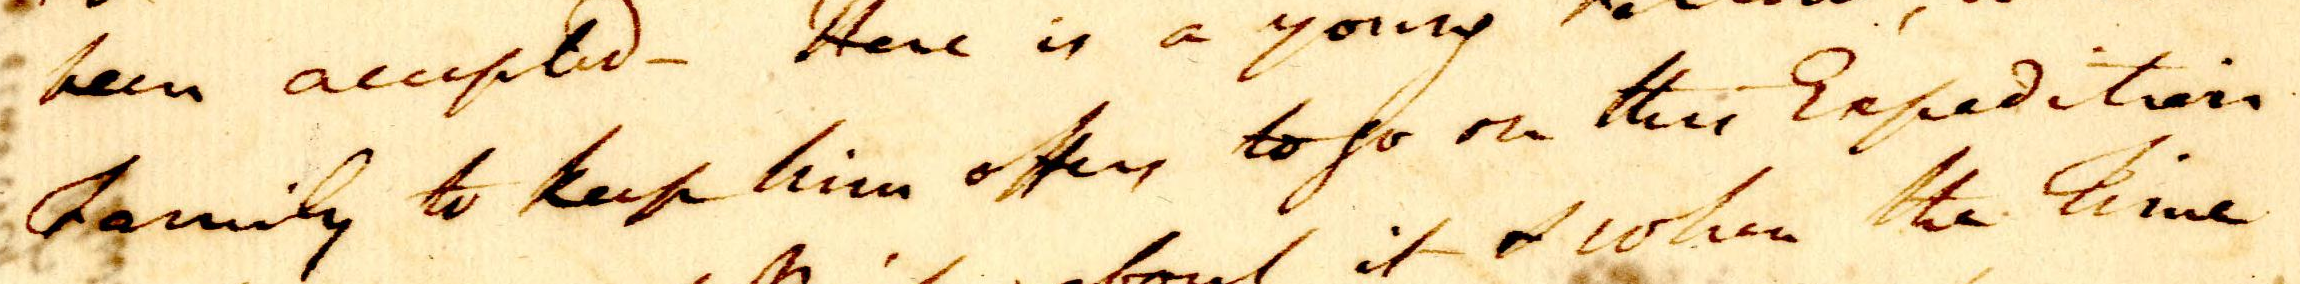family to keep him after to go on this Expedition
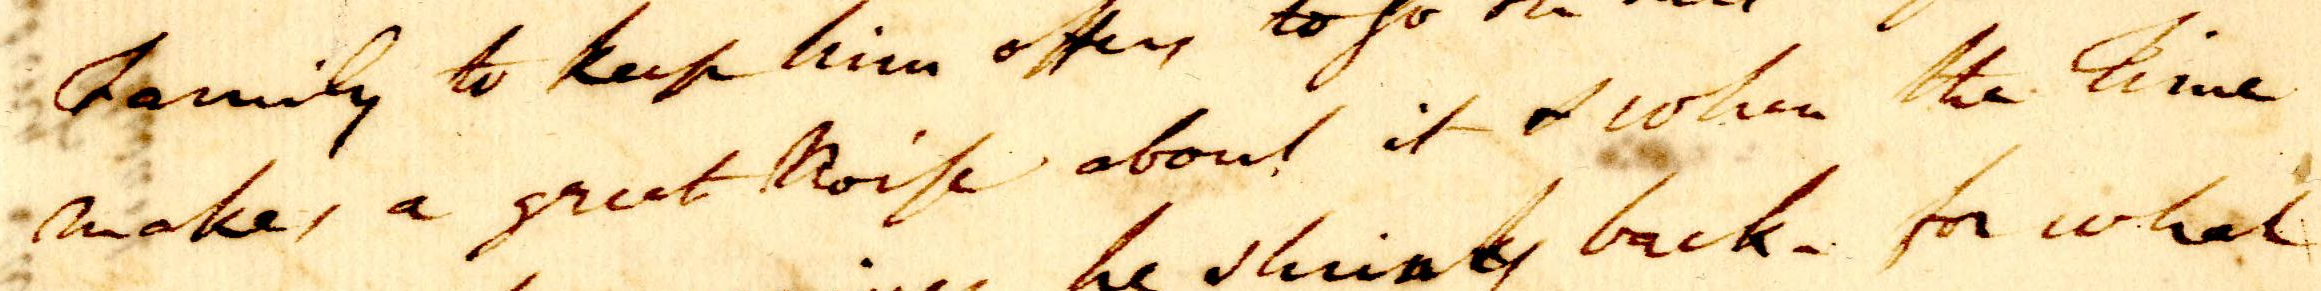makes a greet Noise about it & when the Time
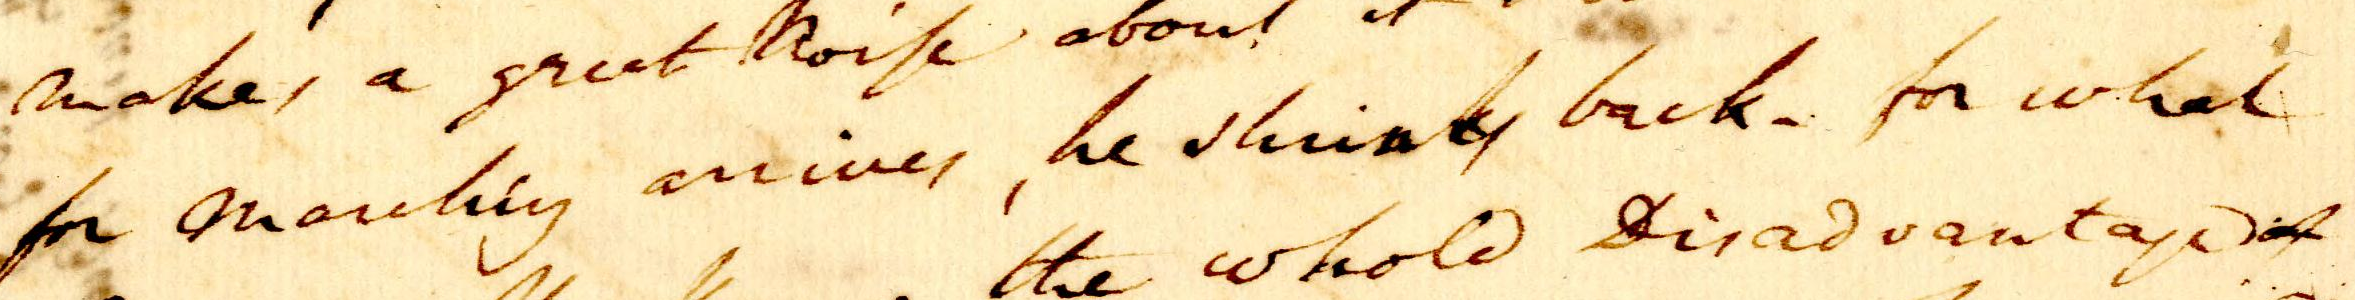for marching arrives, he shrinks back, for what
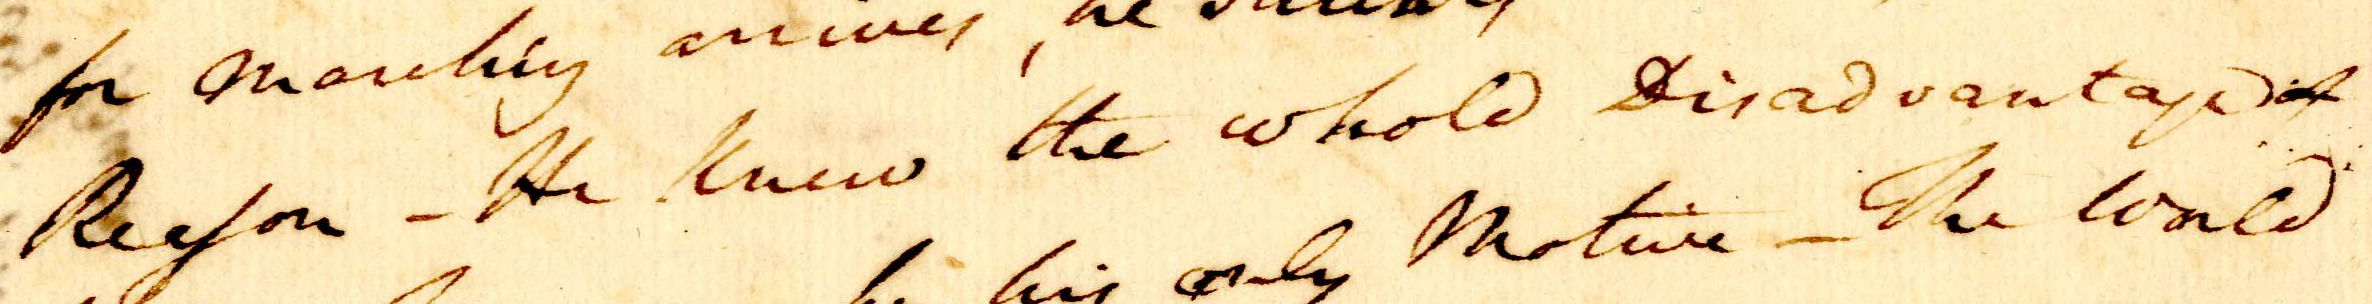Reason. He knew the whole Disadvantage of
